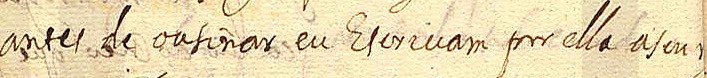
antes de o asinar eu Escriuam por ella a seu r
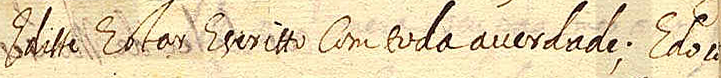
E disse Estar Escritto Com toda a uerdade; E do c
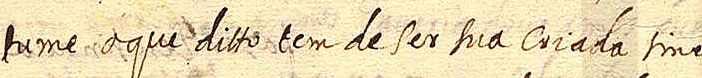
tume o que ditto tem de ser sua criada sinc
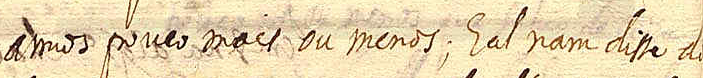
annos pouco mais ou menos; E al nam disse d
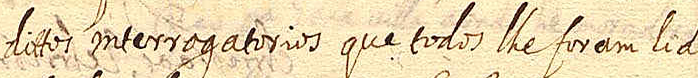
dittos interrogatorios que todos lhe foram lid
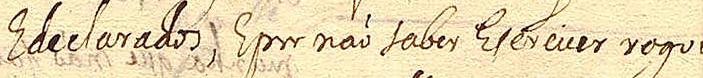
E declarados, E por naõ saber Escreuer rogou
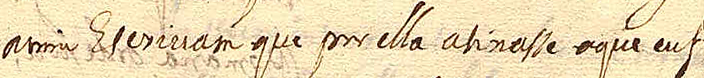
a mim Escriuam que por ella asinasse o que eu fi
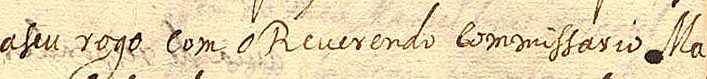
a seu rogo com o Reuerendo commissario Ma
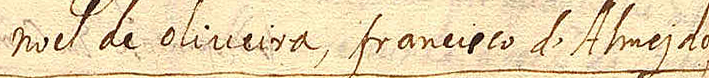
noel de oliueira, francisco d'Almejda
